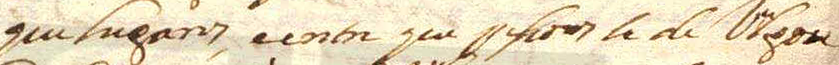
que lugares, e entre que pessoas se deVulgou
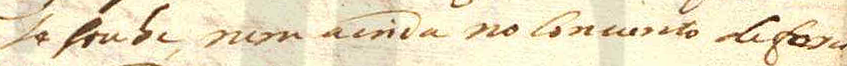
se soube, nem ainda no conuento de ferrei
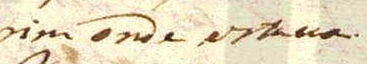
rim onde estaua.
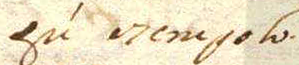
gū escrupolo.
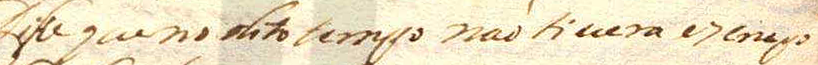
Disse que no dito tempo naõ tiuera escrupo
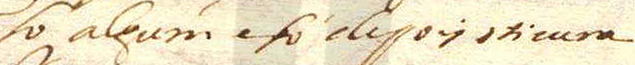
lo algum̄ e só depois o tiuera.
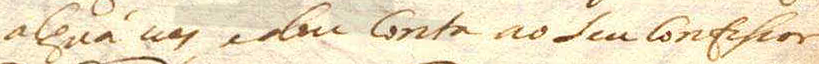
alguā uez, e deu conta ao seu confessor
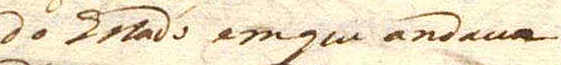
do Estado em que andaua
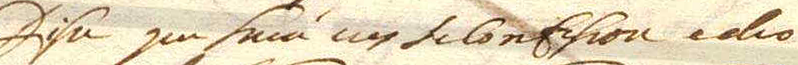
Disse que huā uez se confessou e deo
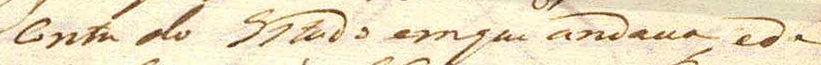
conta do Estado em que andaua, e de
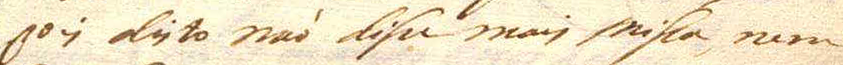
pois disto naõ disse mais missa, nem
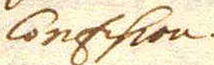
confessou.
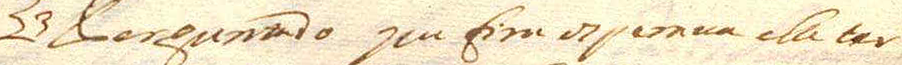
Perguntado que fim esperaua elle ter
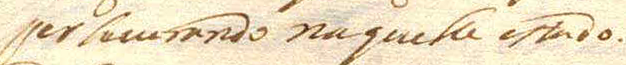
perseuerando naquelle estado.
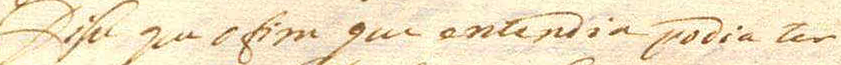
Disse que o fim que entendia podia ter
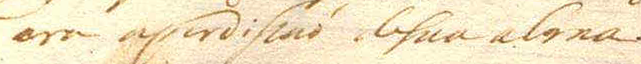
era a perdicaõ de sua alma.
